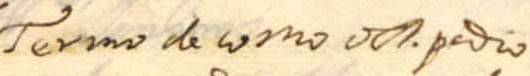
Termo de como o R. pedio
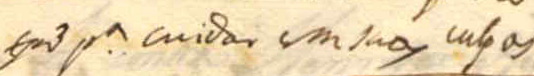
tpō p.a cuidar em suas culpas
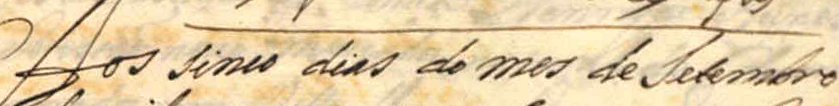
Aos sinco dias do mes de Setembro
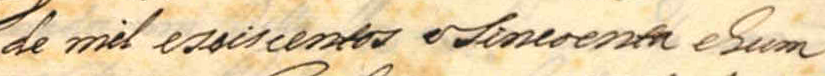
de mil e seiscentos e sincoenta e hum
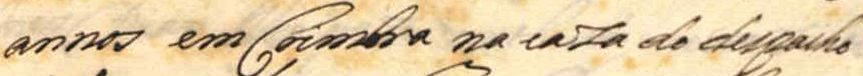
annos em Coimbra na caza do despacho
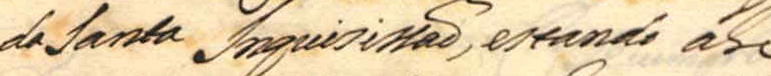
da Santa Inquisissão, estando ahi
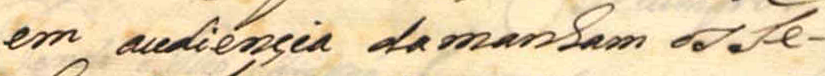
em audiençia da manham os Se
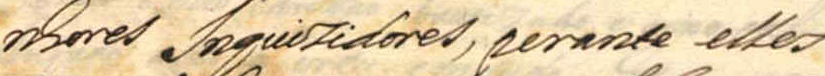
nhores Inquizidores, perante elles
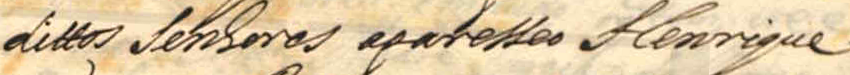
dittos Senhores aparesseo Henrique
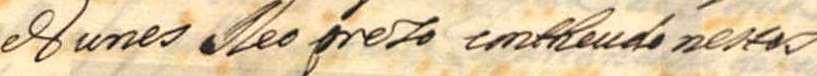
Nunes Reo prezo contheudo nestes
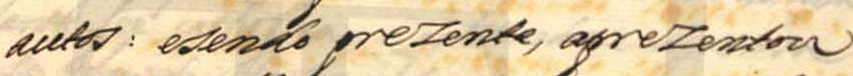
autos: e sendo prezente, aprezentou
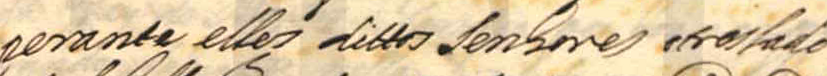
perante elles dittos senhores o treslado
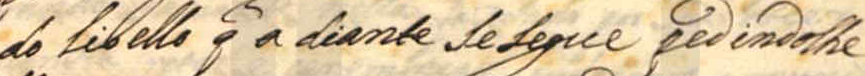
do libello q̅ a diante se segue pedindolhe
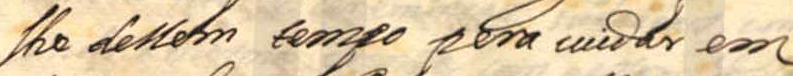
lhe dessem tempo pera cuidar em
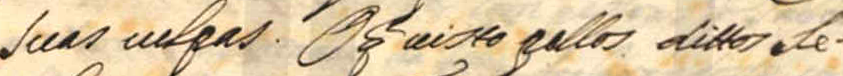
suas culpas. O q̅ uisto pellos dittos Se
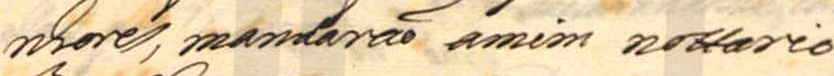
nhores, mandarão a mim nottario
